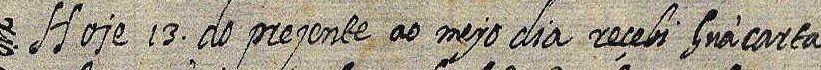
Hoje 13. do prezente ao meyo dia reçebi huā carta
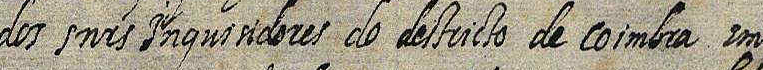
dos snr̄s Inquisidores do destricto de coimbra em
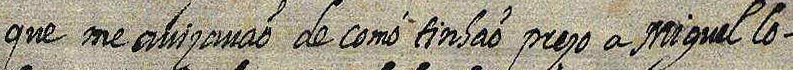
que me auizauaõ de como tinhaõ prezo a Miguel lo
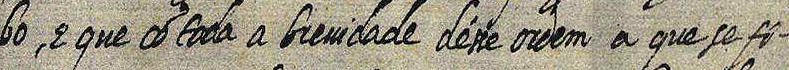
bo, E que cō toda a breuidade désse ordem a que se fi
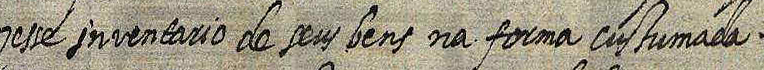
zesse jnventario de seus bens na forma custumada.
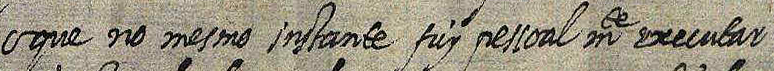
o que no mesmo instante fuy pessoalmte Executar
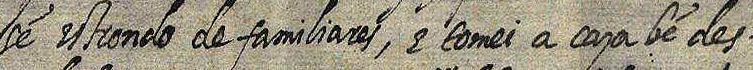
sē Estrondo de familiares, E tomei a caza bē des
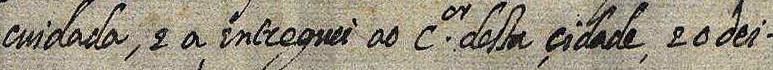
cuidada, E a Entreguei ao C.or desta cidade, E o dei
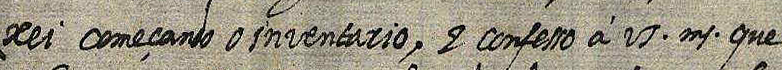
xei começando o inventario, E confesso à vs. ms. que
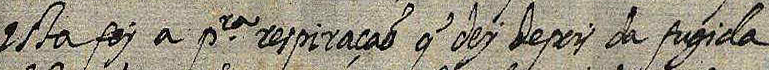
Esta foy a p.ra respiração q̄ dey depois da fugida
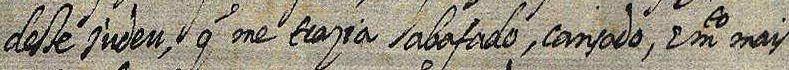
deste judeu, q̄ me trazia abafado, cansado, E mto mais
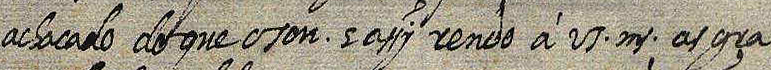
achacado do que o sou. E assȳ rendo à vs. ms. as gra
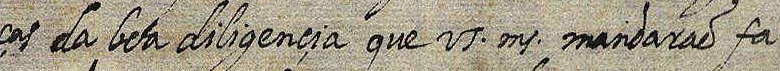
ças da boa diligençia que vs. ms. mandaraõ fa
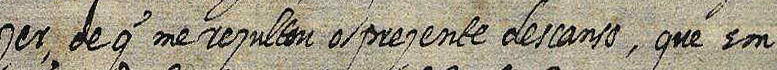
zer, de q̄ me rezultou o prezente descanso, que Em
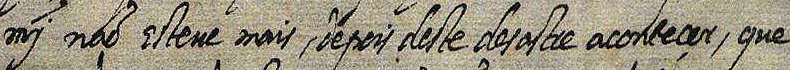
mȳ naõ Esteue mais, depois deste desastre acontecer, que
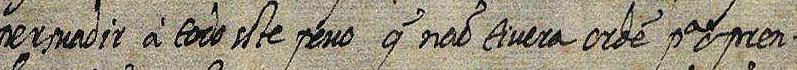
persuadir à todo este pouo q̄ naõ tiuera ordē pa o pren
